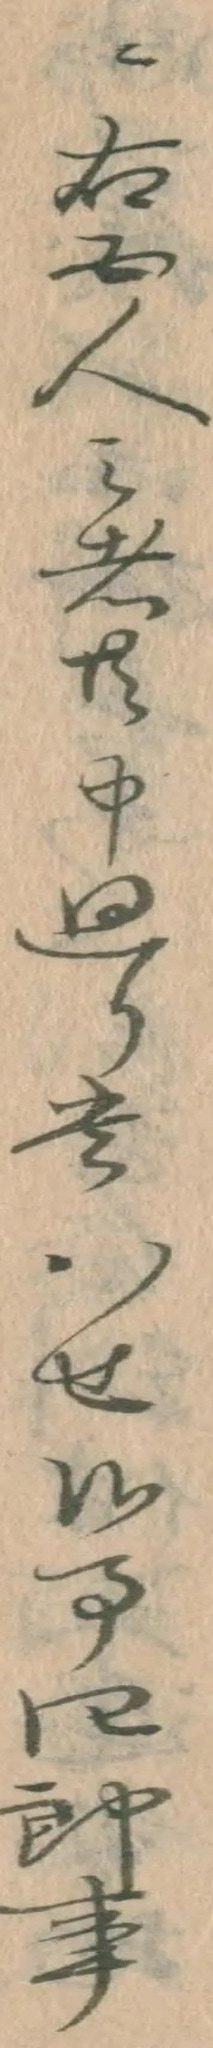に右五人之者共申廻り貴はせ候事四郎事
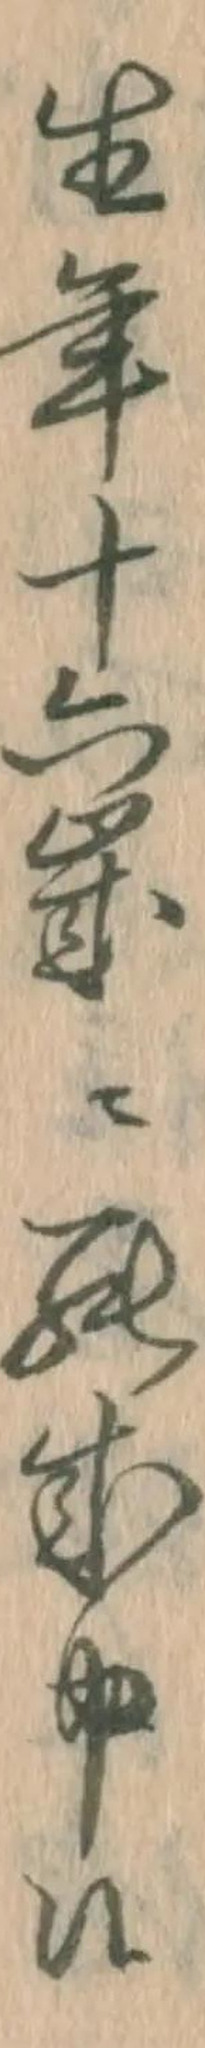生年十六歳に罷成申候
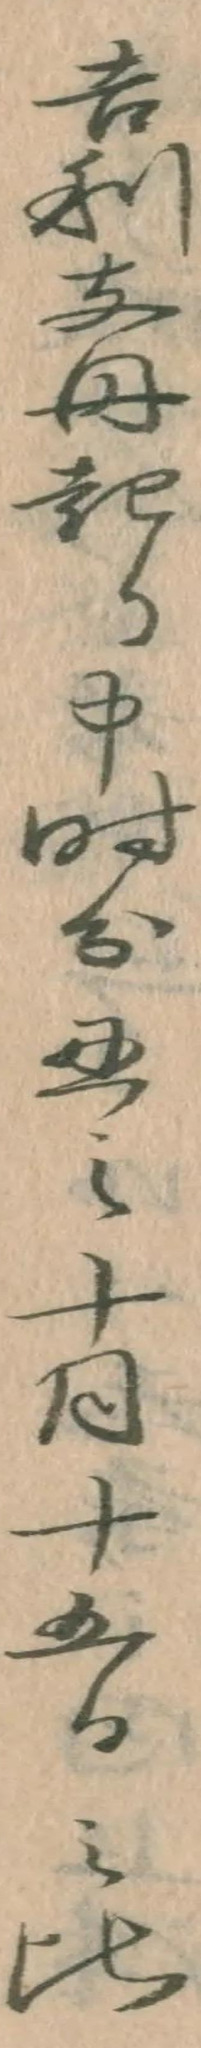一吉利支丹起り申時分丑之十月十五日之比
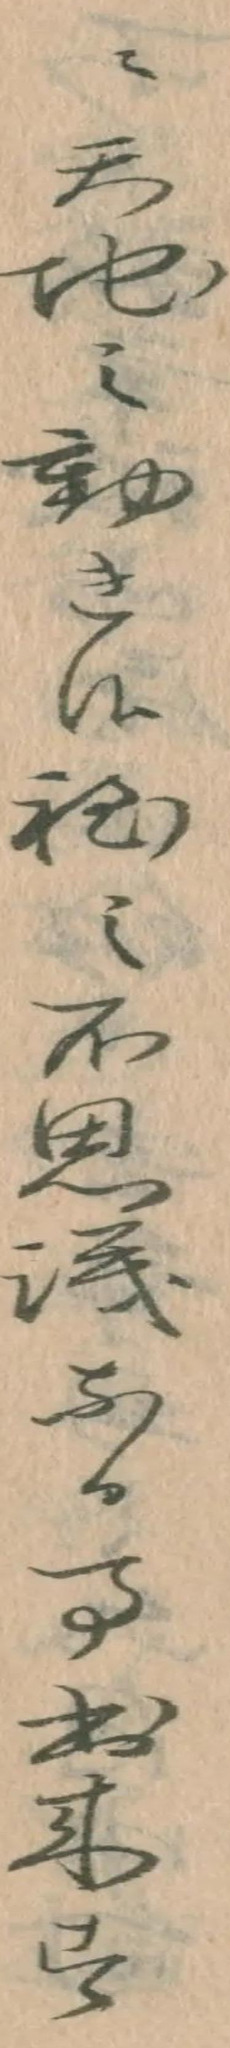に天地之動き候程之不思議なる事出来春
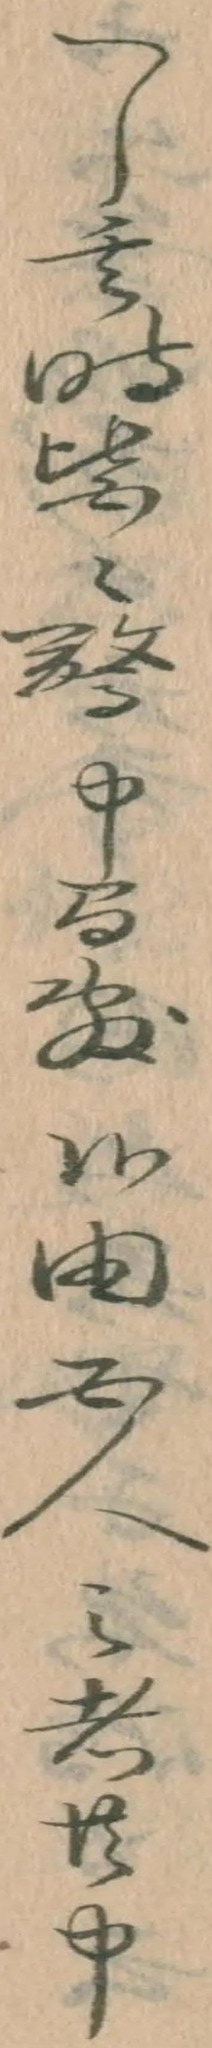へし其時皆々驚申間敷候由五人之者共申
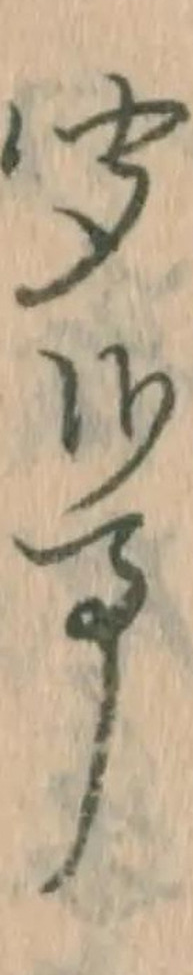聞候事
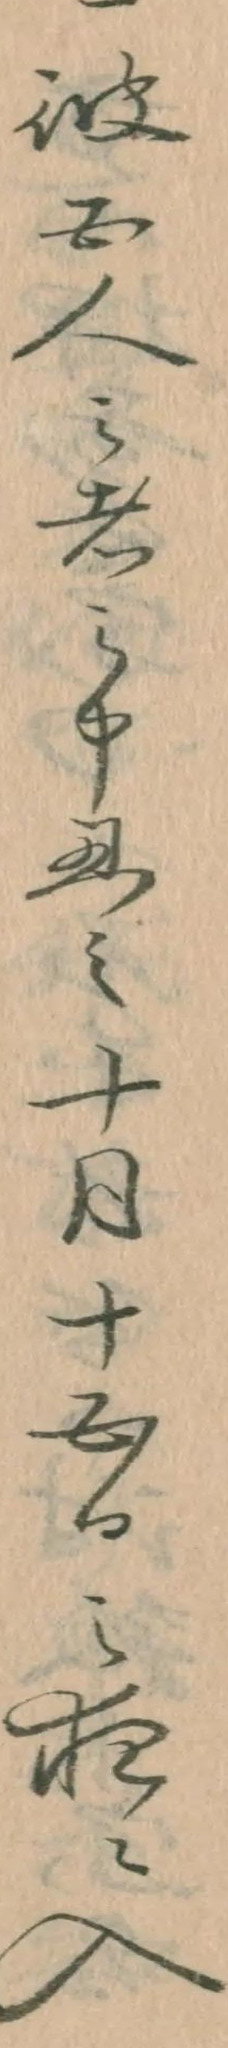一彼五人之者之申丑之十月十五日之夜に入
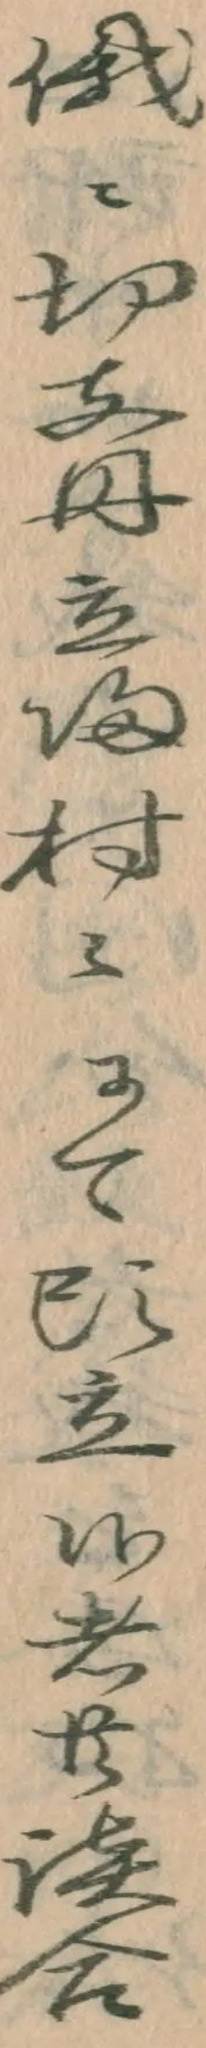俄に切支丹立帰村々尓て頭立候者共談合
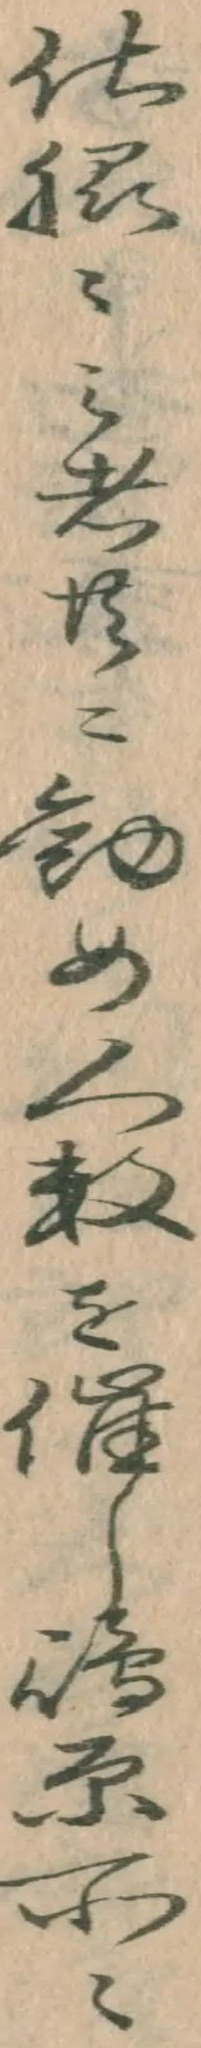仕脇々之者共に勧め人数を催し島原所々
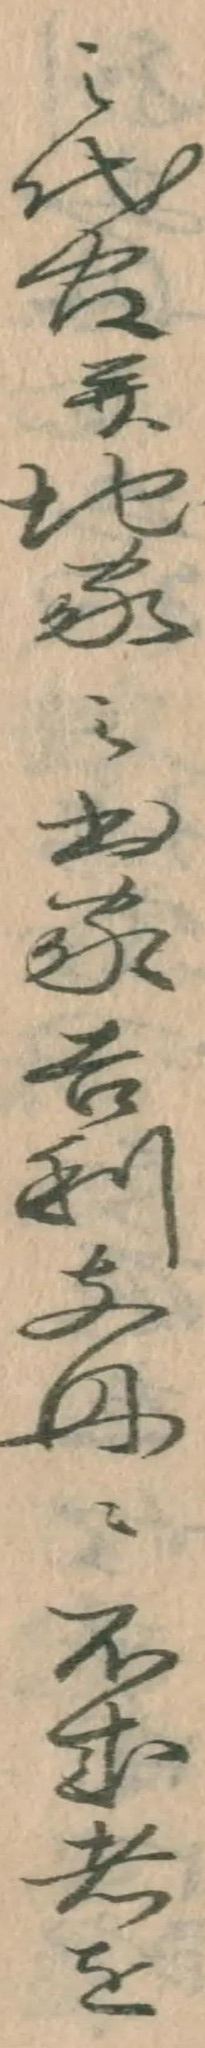之代官幷地家之出家吉利支丹に不成者を
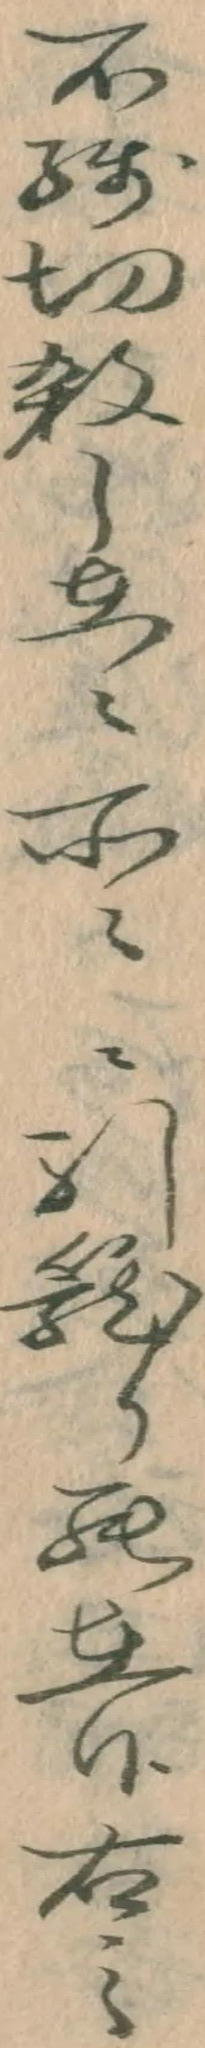不残切殺し在々所々に引籠り罷在候右之
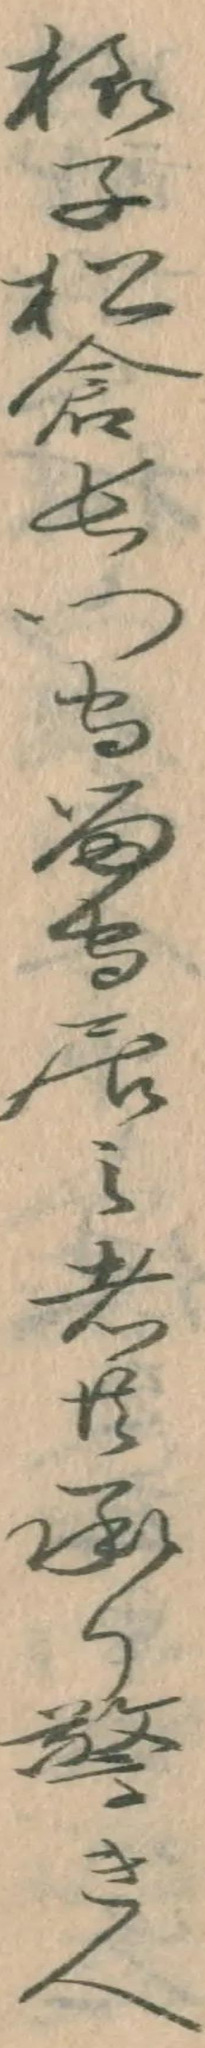様子松倉長門守留守居之者共承り驚き人
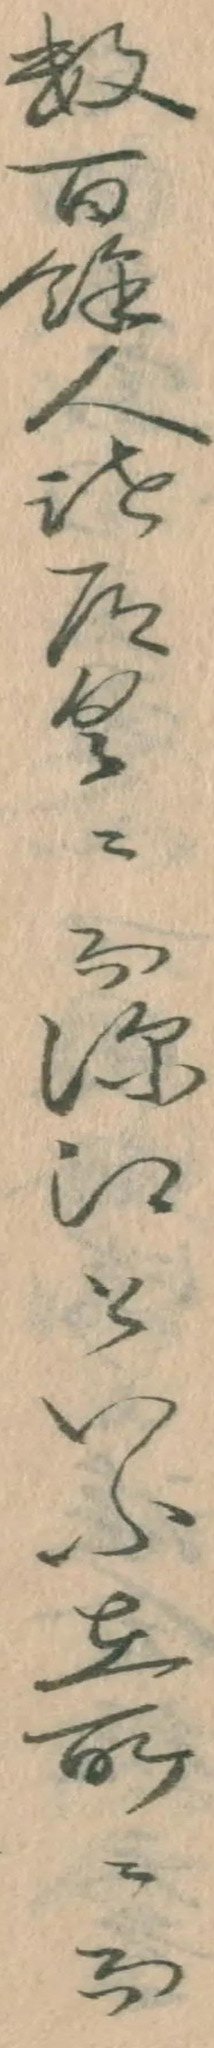数百余人諸道具に而深江といふ在所に而
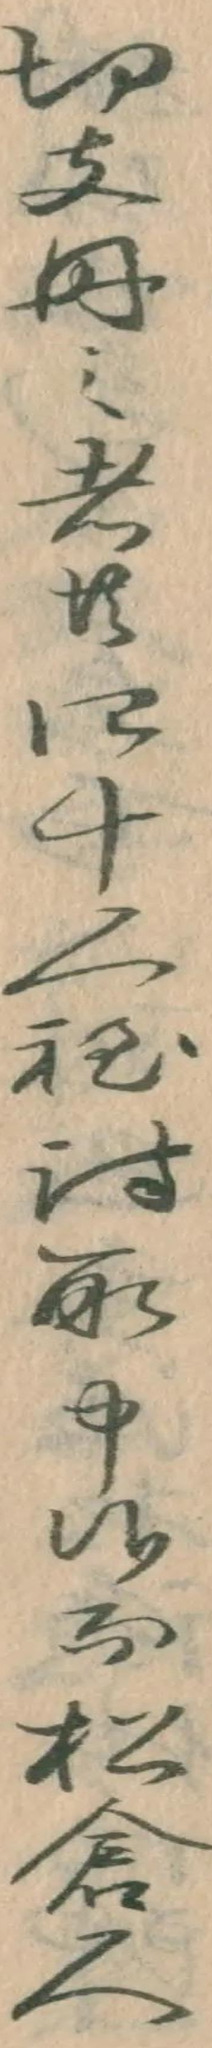切支丹之者共四十人程討取申候而松倉人
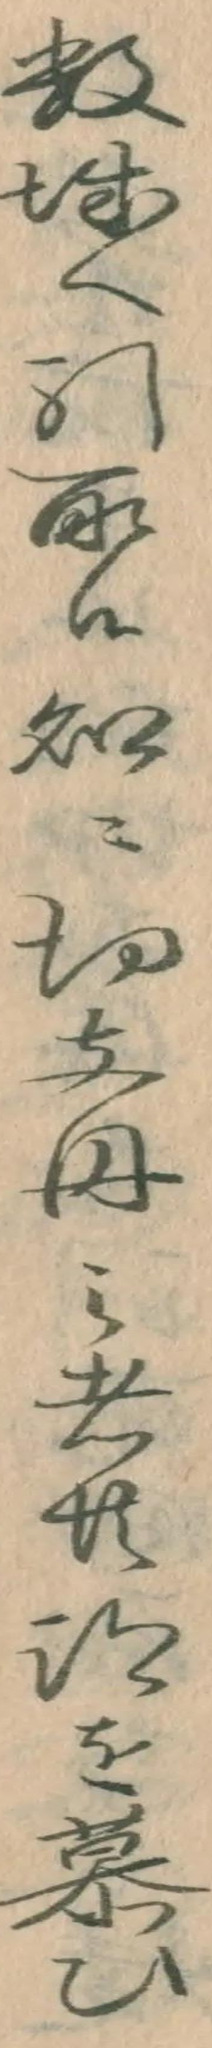数城へ引取候処に切支丹之者共跡を慕ひ
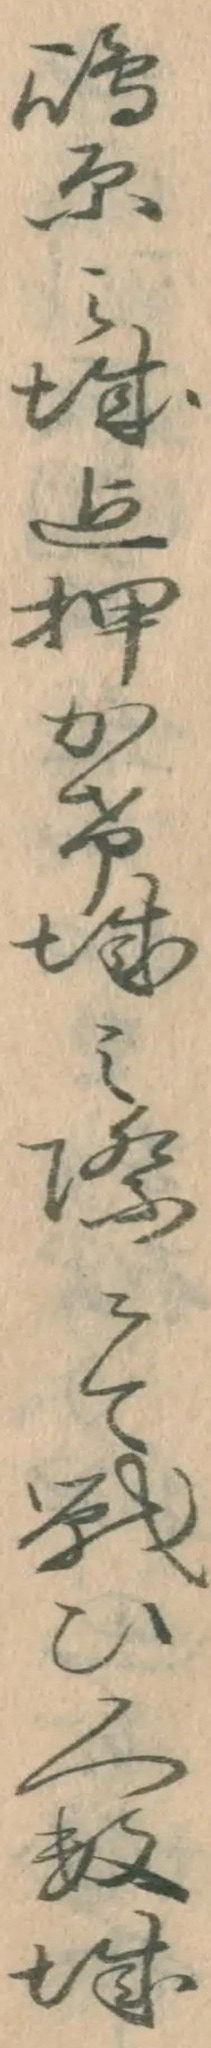島原之城迄押加希城之際にて戦ひ人数城
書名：切支丹御退治記 49巻. [9]
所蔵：国立国会図書館 National Diet Library, JAPAN
